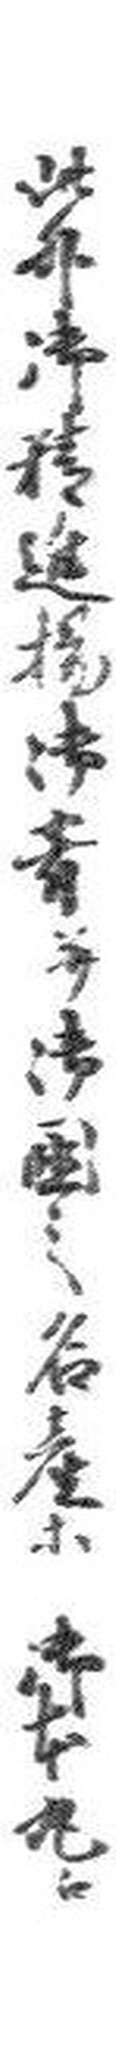此外御精進揚御肴并御国之名産等御本丸江
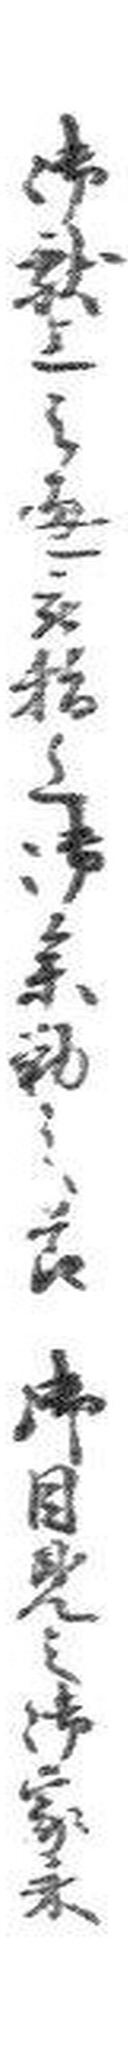御献上之通被指上御参勤之節御目見之御家来
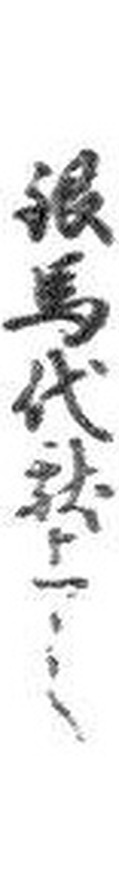銀馬代献上之

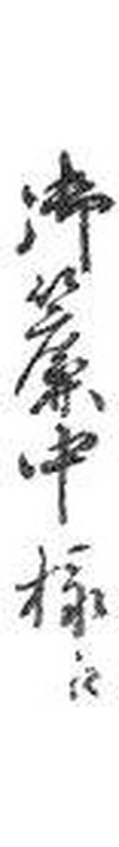御簾中様江
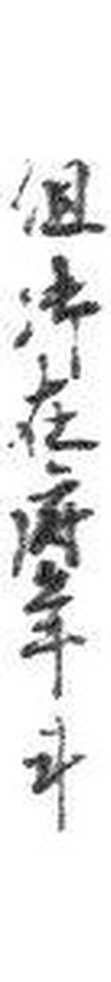但御在府年計
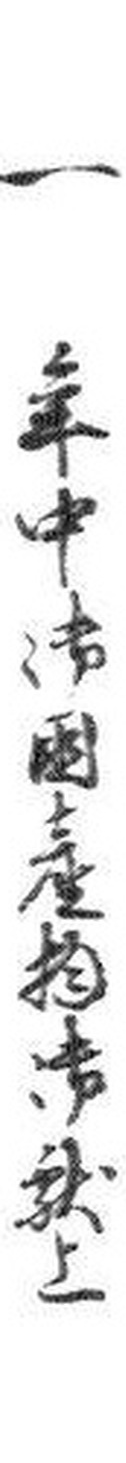一年中御国産物御献上

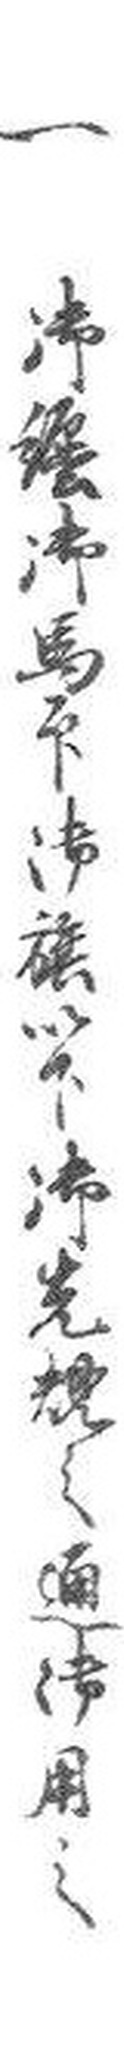一御纏御馬印御旗以下御先規之通御用之
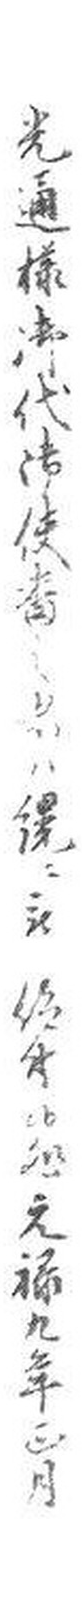光通様御代御使番之者ハ縨ニ被仰付候処元禄九年正月
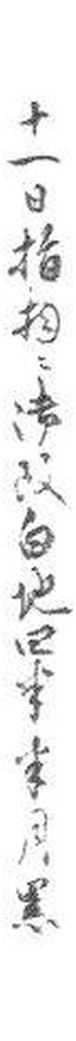十一指物ニ御改白地四半半月黒
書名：家譜 二十六 吉品公 従宝永七年到正徳二年
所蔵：福井県文書館 Fukui Prefectural Archives
